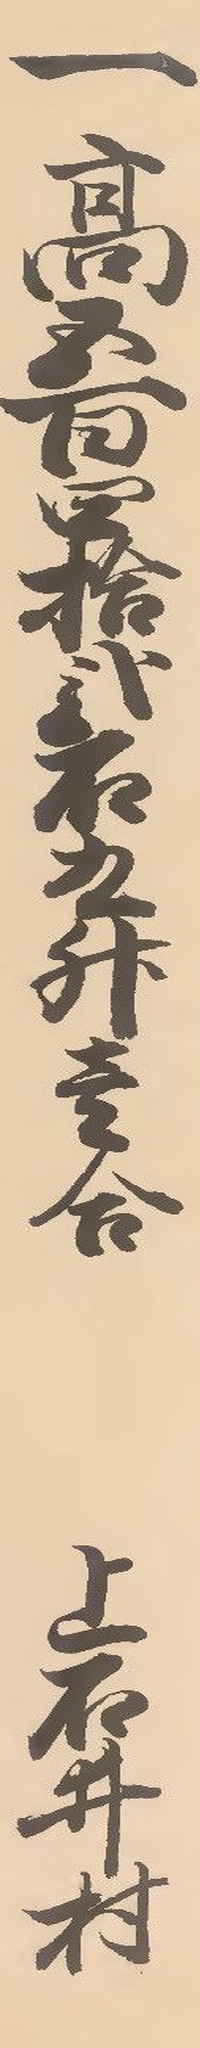一高五百四拾弐石九升壱合上石井村
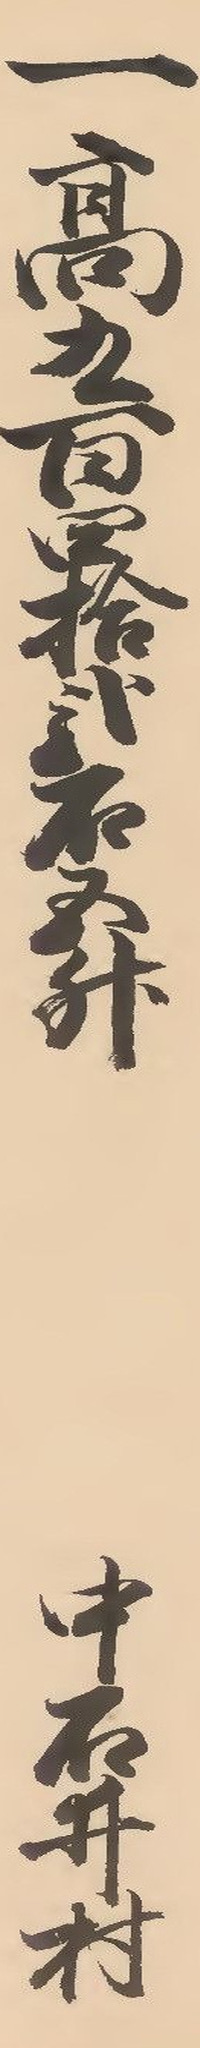一高九百四拾弐石五升中石井村
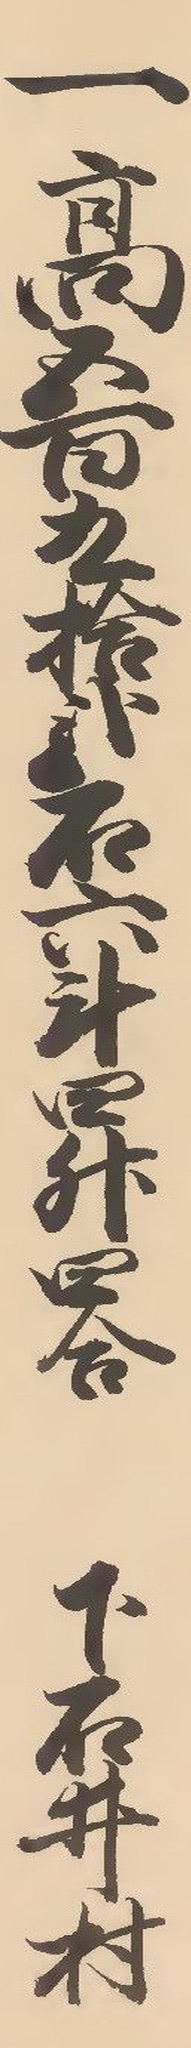一高五百九拾弐石六斗四升四合下石井村
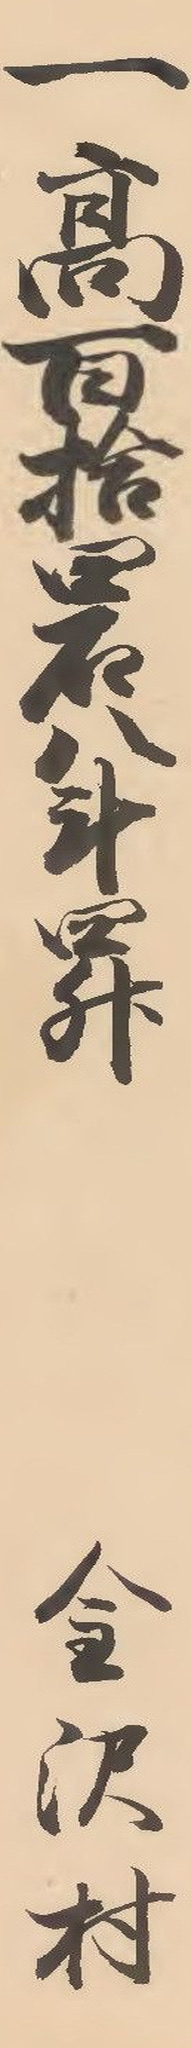一高百拾四石八斗四升金沢村

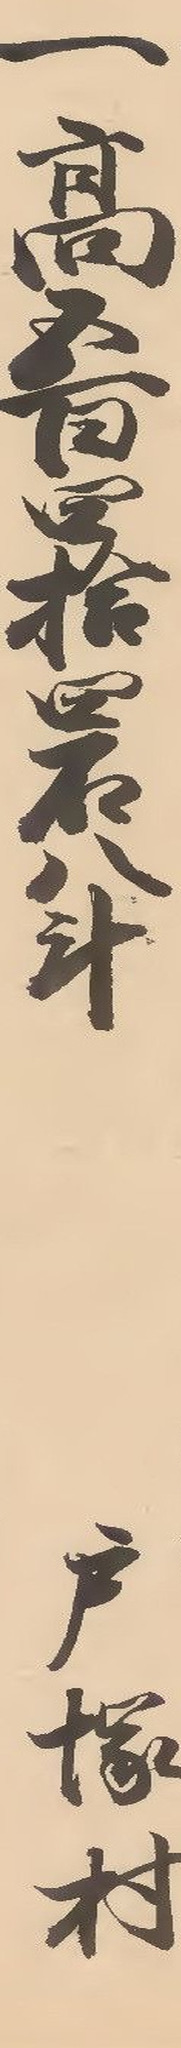一高五百四拾四石八斗戸塚村
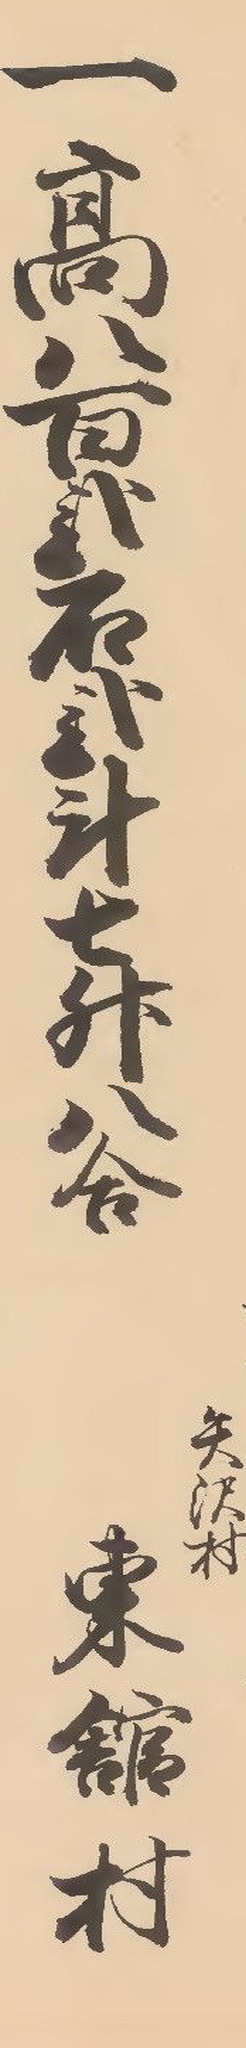一高八百弐石弐斗七升八合東館村
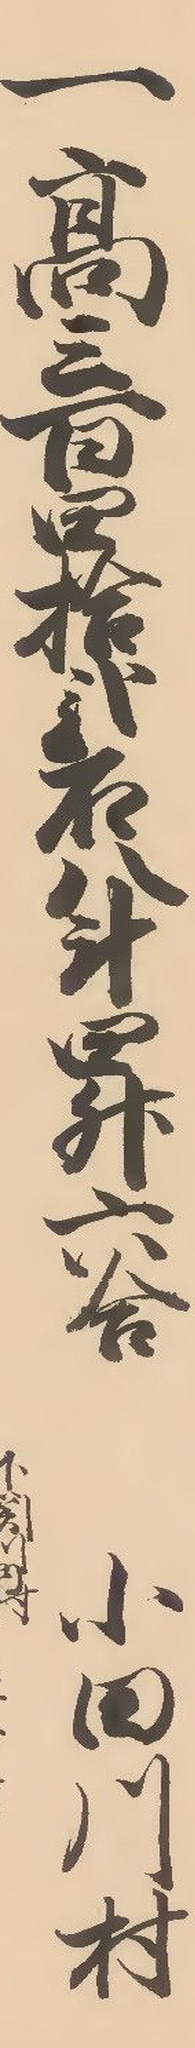一高三百四拾弐石八斗四升六合小田川村
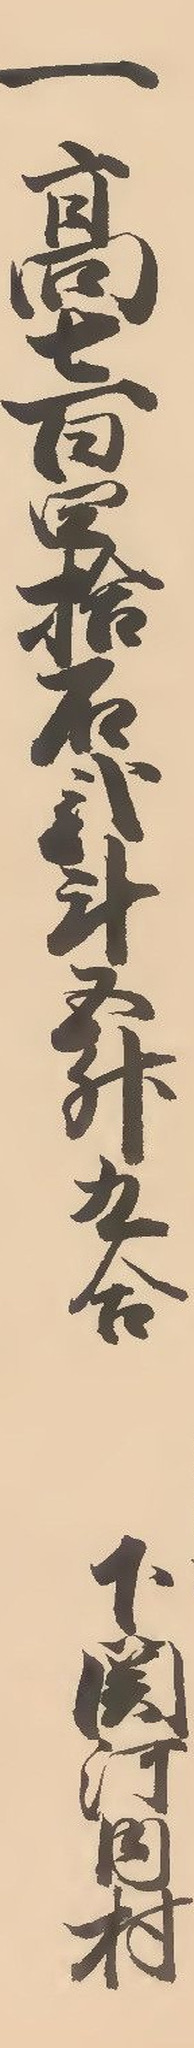一高七百四拾石弐斗五升九合下関河内村
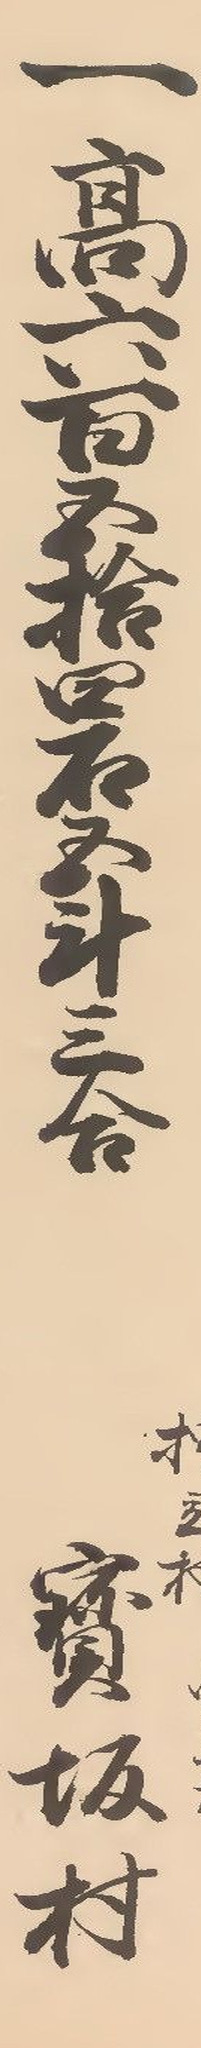一高六百五拾四石五斗三合宝坂村
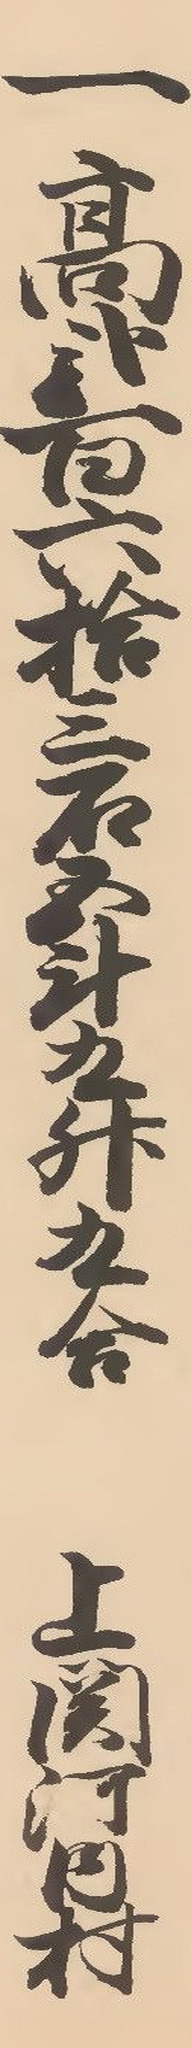一高弐百六拾三石五斗九升九合上関河内村
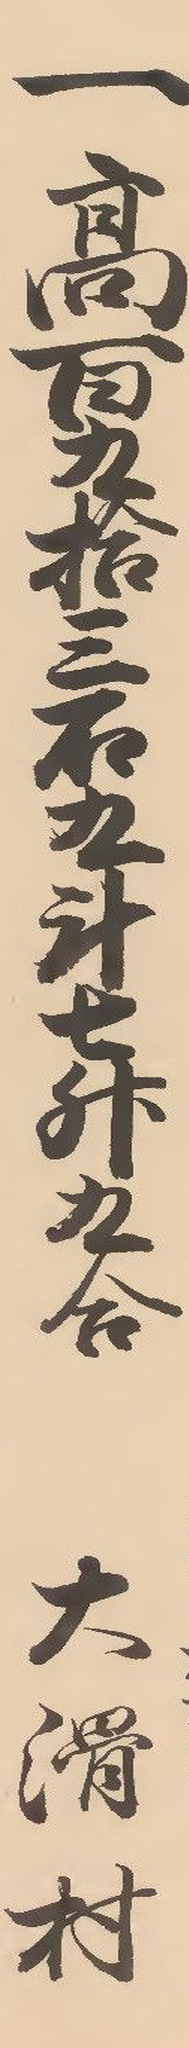一高百九拾三石九斗七升九合大滑村
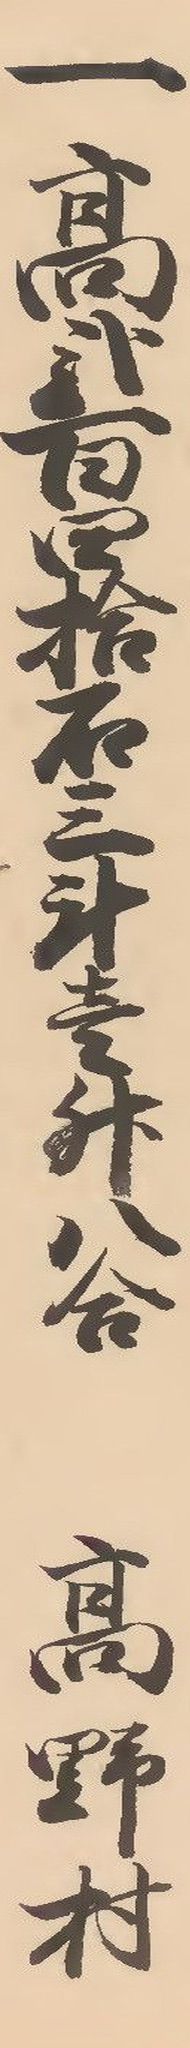一高弐百四拾石三斗壱升八合高野村

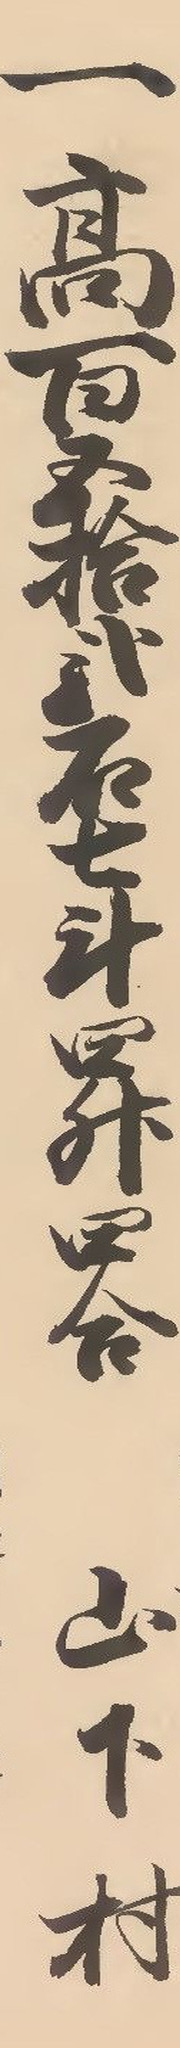一高百五拾弐石七斗四升四合山下村
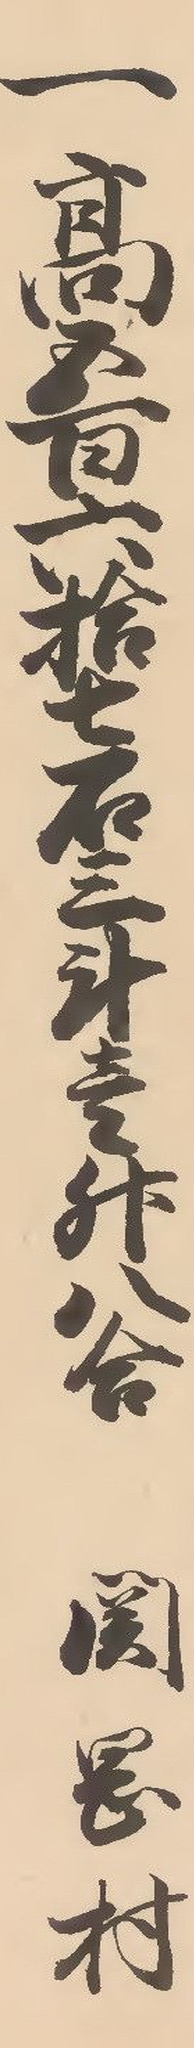一高五百六拾七石三斗壱升八合関岡村
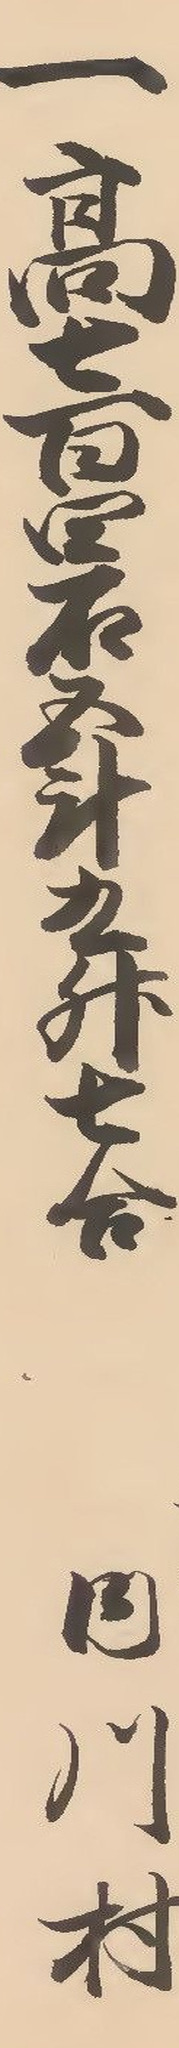一高七百四石五斗九升七合内川村
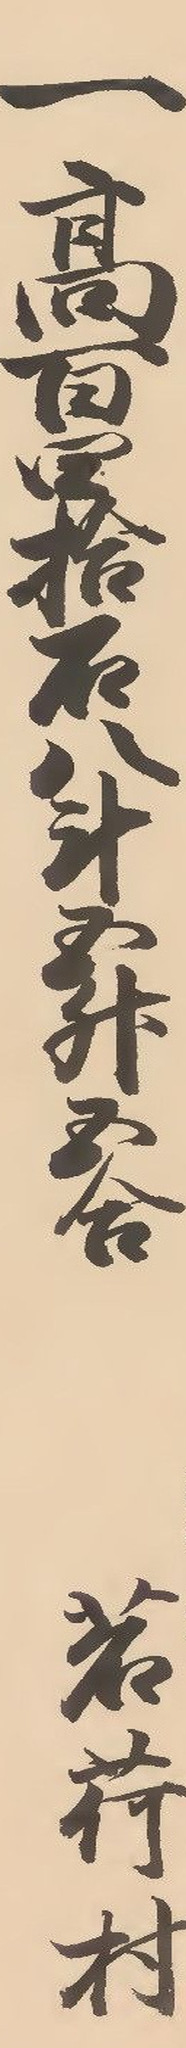一高百四拾石八斗五升五合若荷村
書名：陸奥国郷帳　３
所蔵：国立公文書館 National Archives of Japan
